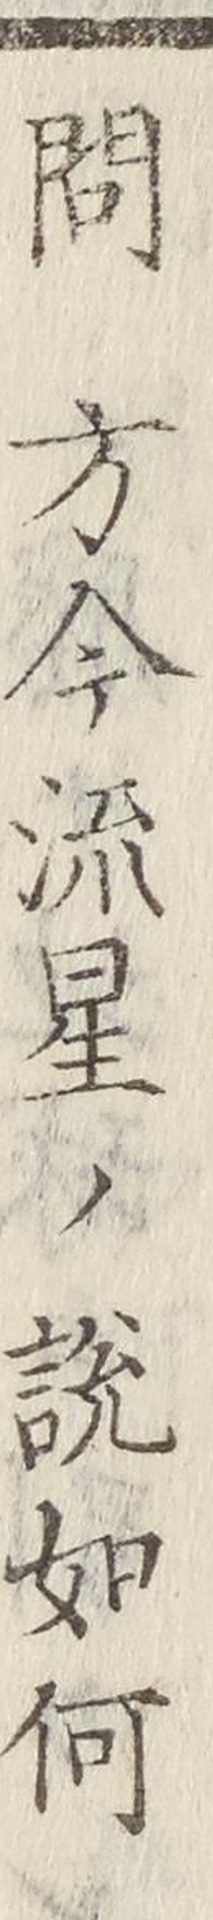問方今流星ノ説如何
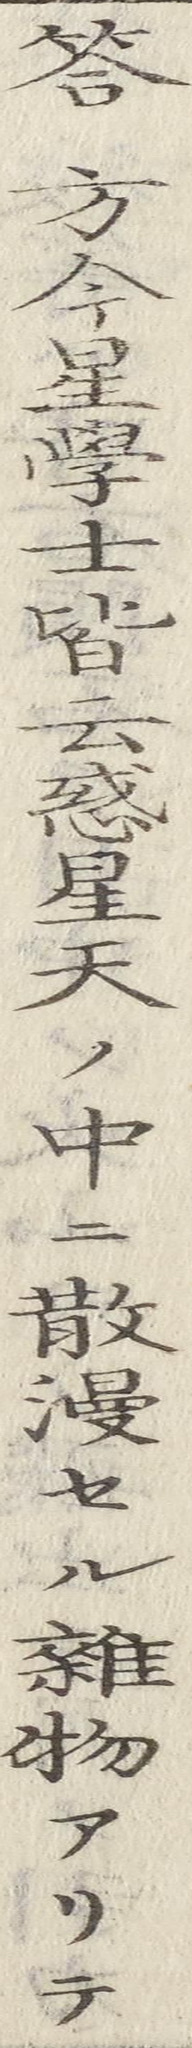答方今星学士皆云惑星天ノ中ニ散漫セル雑物アリテ
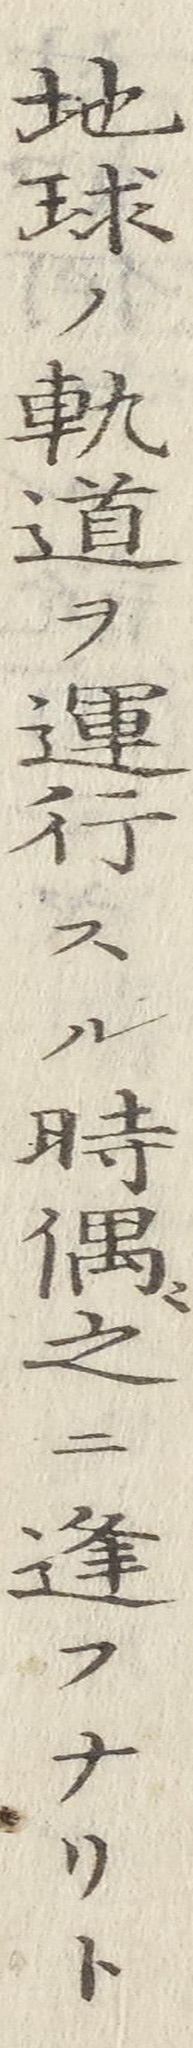地球ノ軌道を運行スル時偶々之ニ逢フナリト
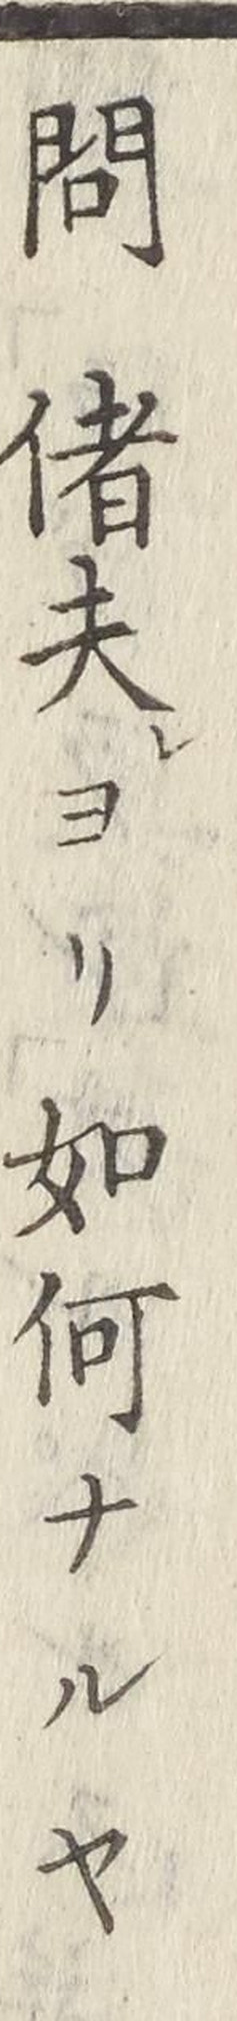問偖夫レヨリ如何ナルヤ
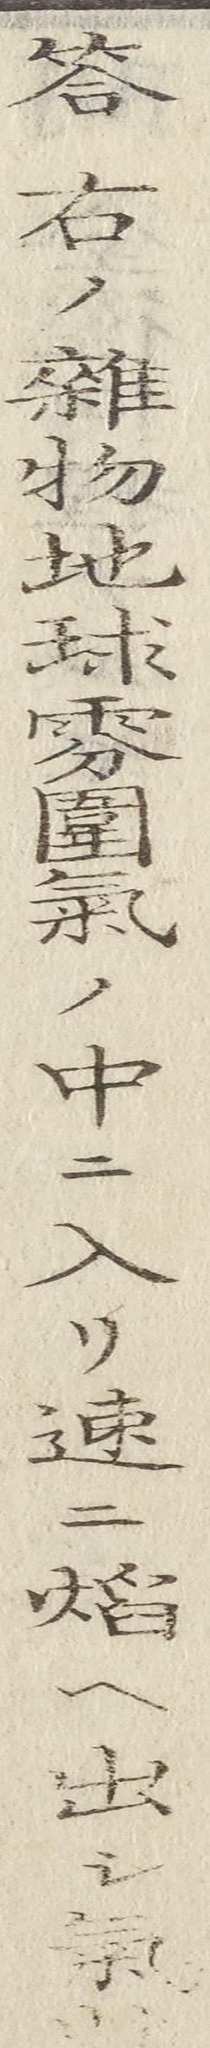答右ノ雑物地球雰囲気ノ中ニ入リ速ニ焔ヘ出シ気状
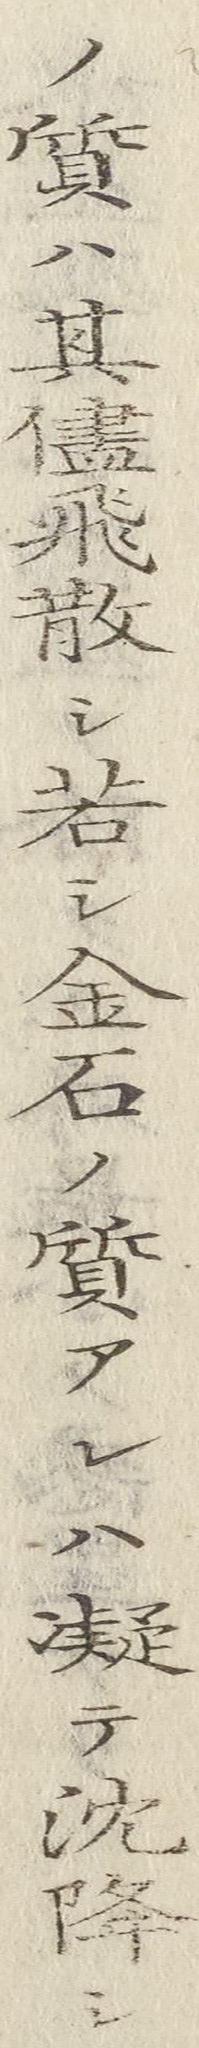ノ質ハ其儘飛散シ若シ金石ノ質アレハ凝テ沈降シ
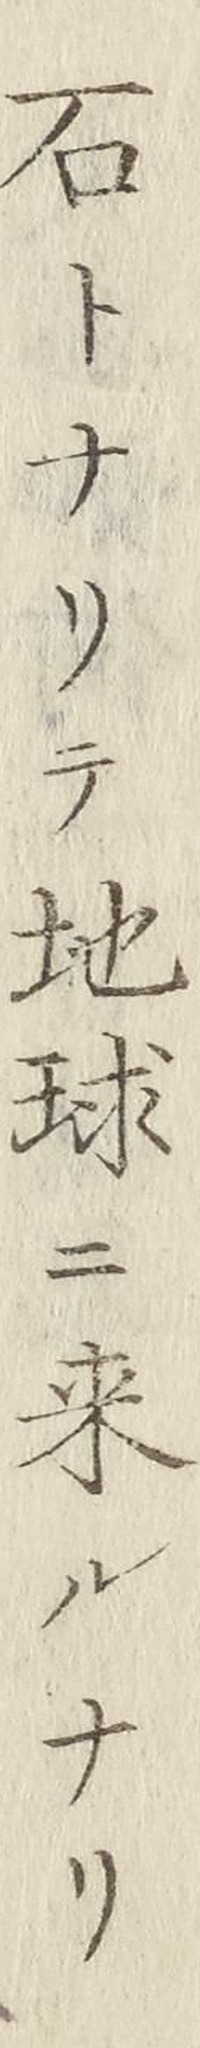石トナリテ地球ニ来ルナリ
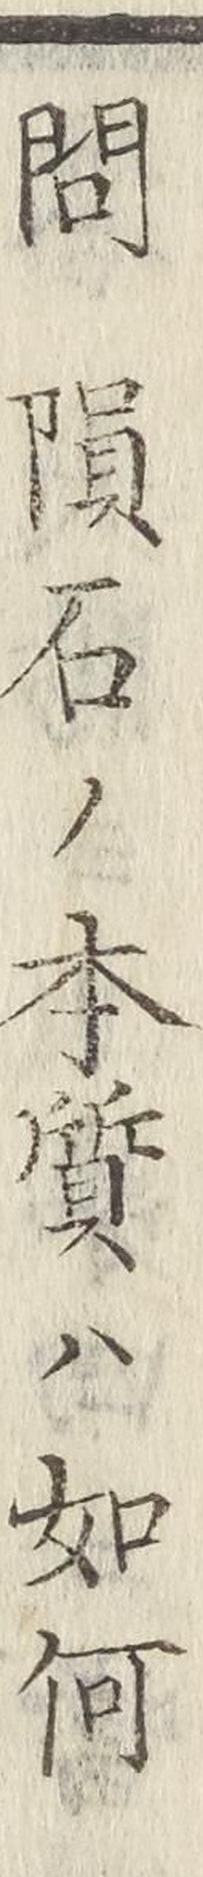問隕石ノ本質ハ如何
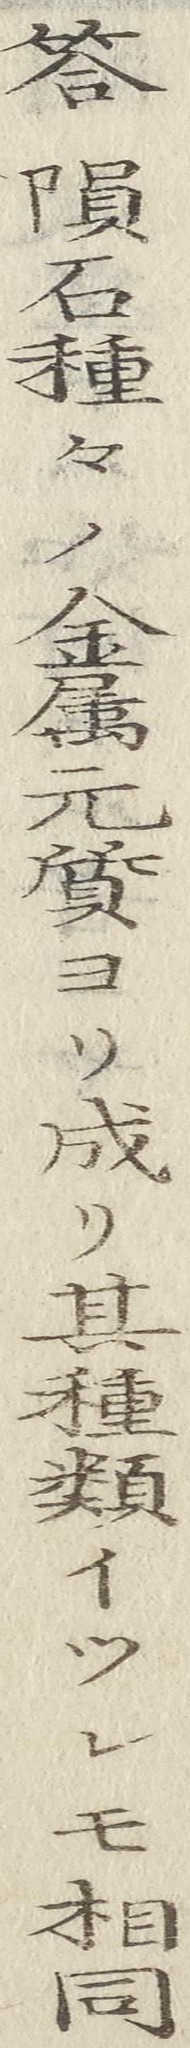答隕石種々ノ金属元質ヨリ成リ其種類イツレモ相同
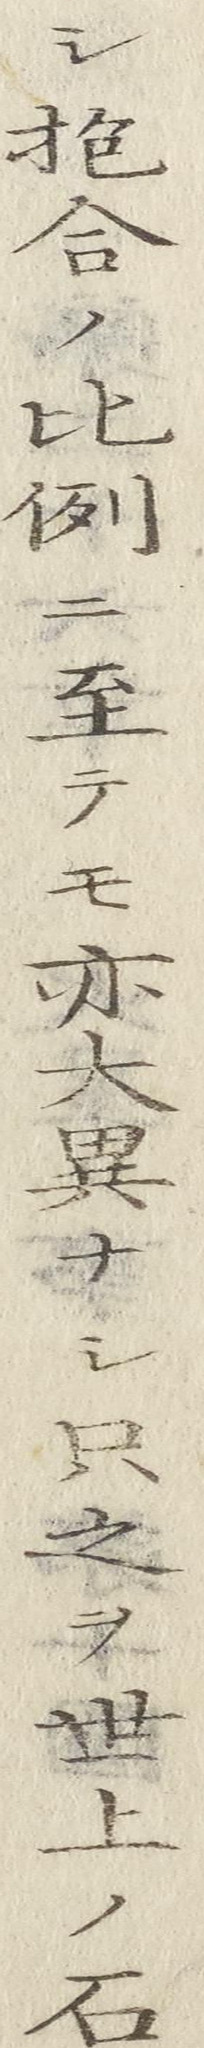シ抱合ノ比例ニ至テモ亦大異ナシ只之ヲ世上ノ石
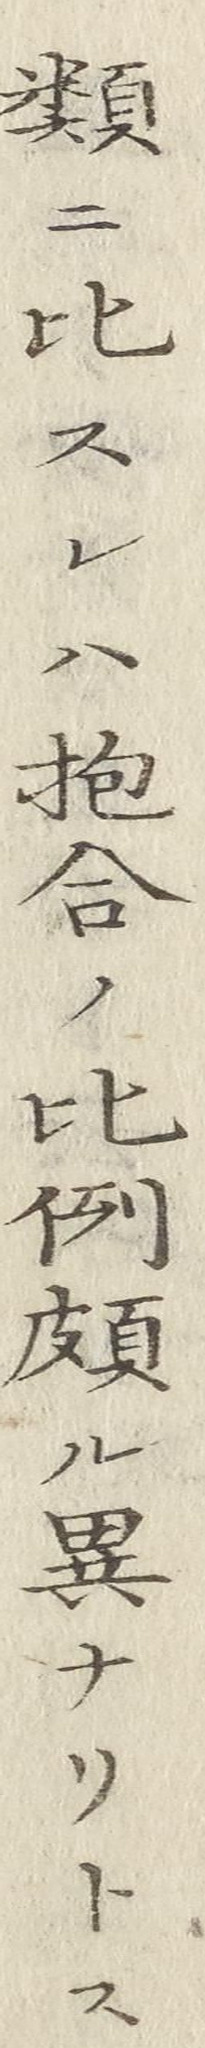類ニ比スレハ抱合ノ比例頗ル異ナリトス
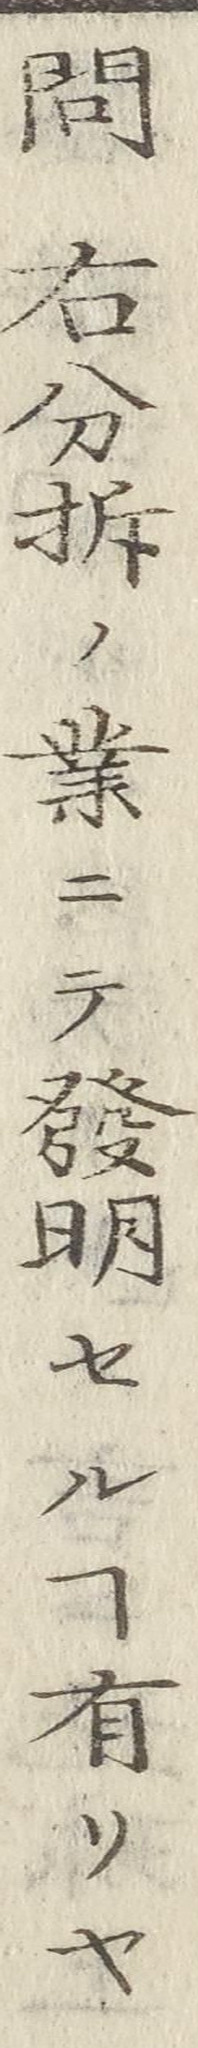問右分析ノ業ニテ発明セルコト有リヤ
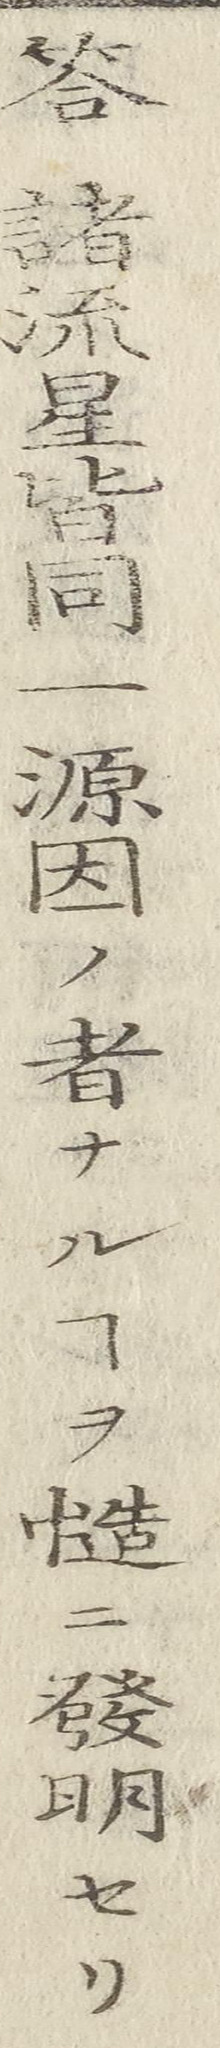答諸流星皆同一源因ノ者ナルコトヲ慥ニ発明セリ
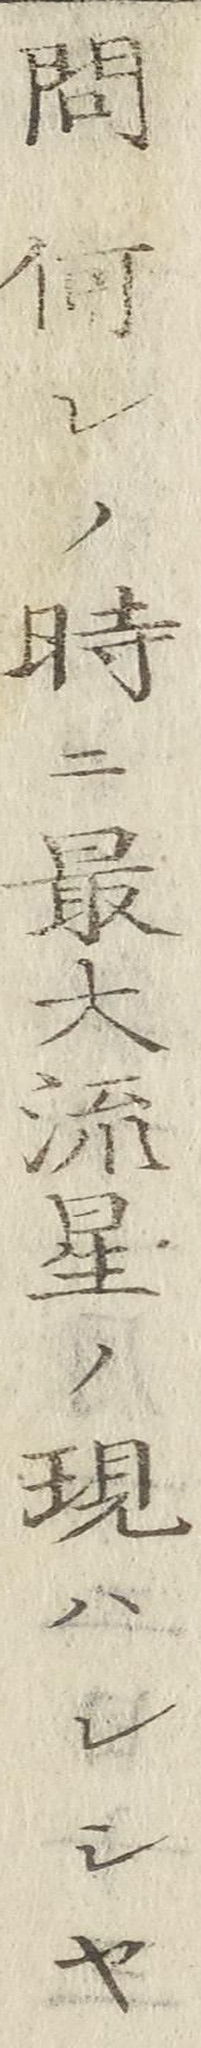問何レノ時ニ最大流星ノ現ハレシヤ

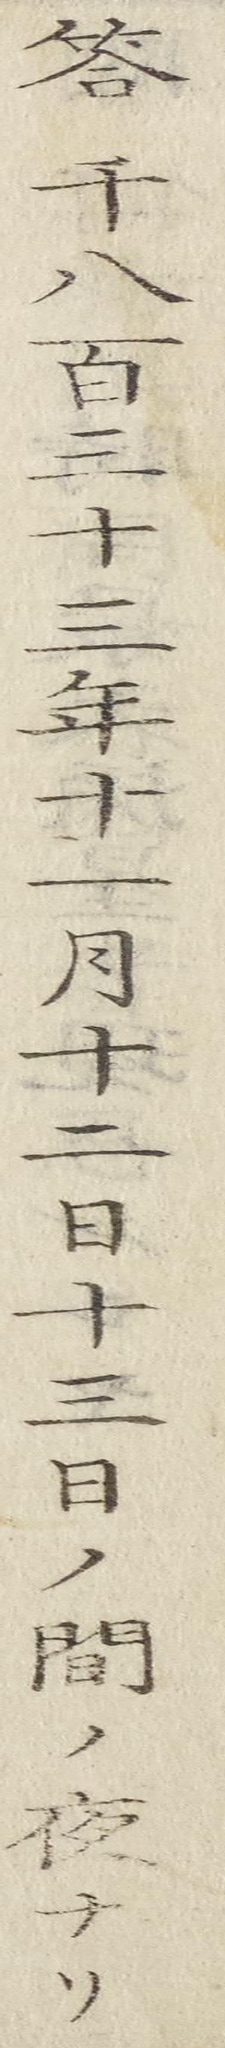答千八百三十三年十一月十二日十三日ノ間ノ夜ナリ
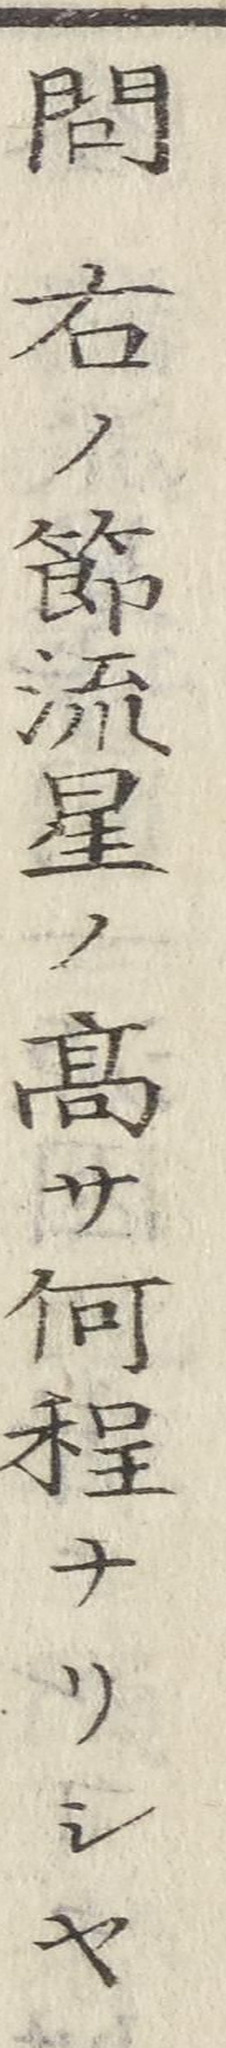問右ノ節流星ノ高サ何程ナリシヤ
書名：星学圖説　上
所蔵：東京大学地震研究所図書室 Earthquake Research Institute Library, The University of Tokyo, JAPAN
